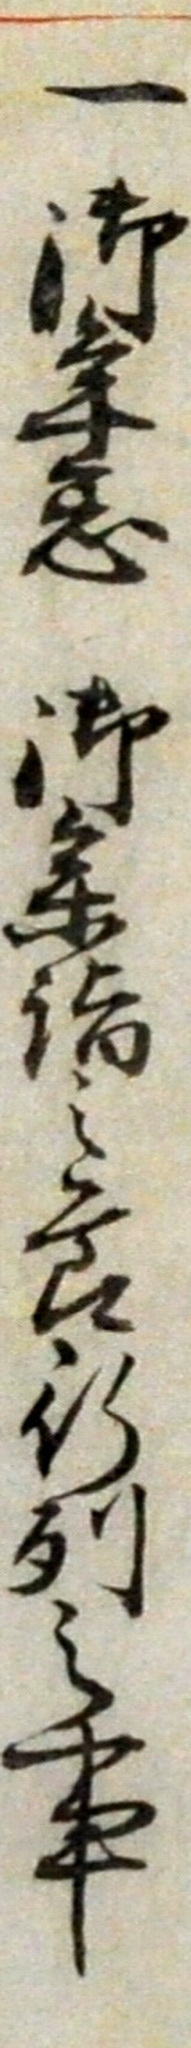一御年忌御参詣之節行列之事
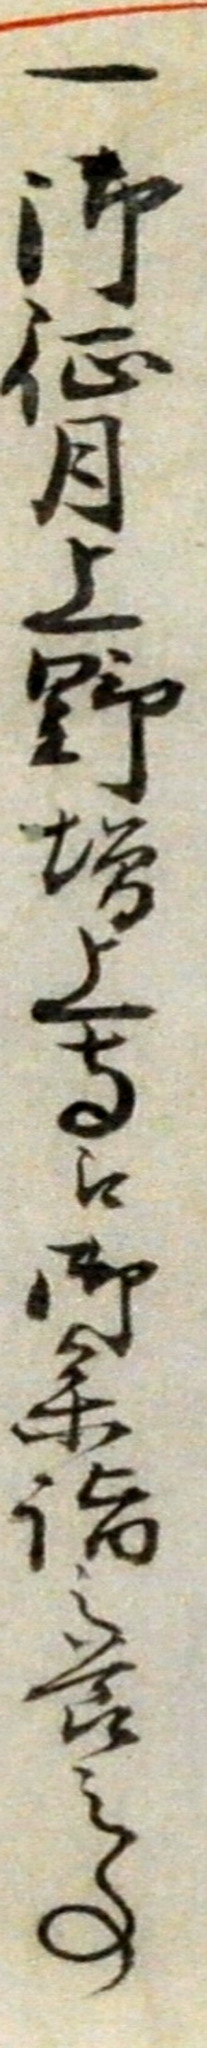一御征月上野増上寺え御参詣之節之事
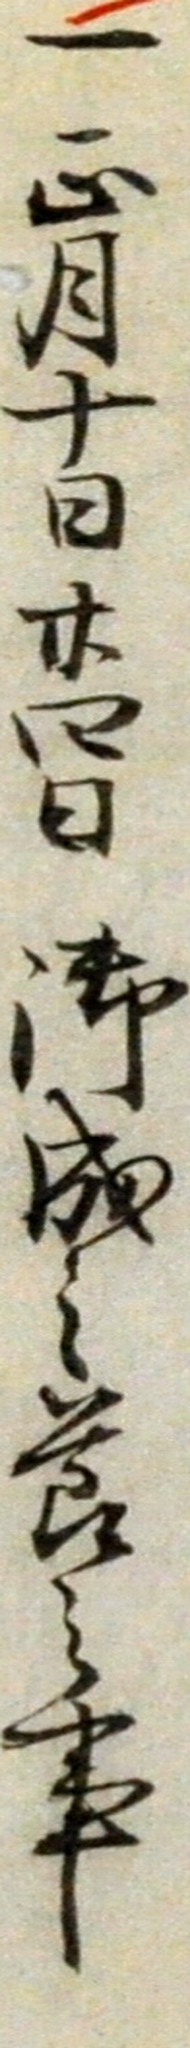一正月十日廿四日御成之節之事
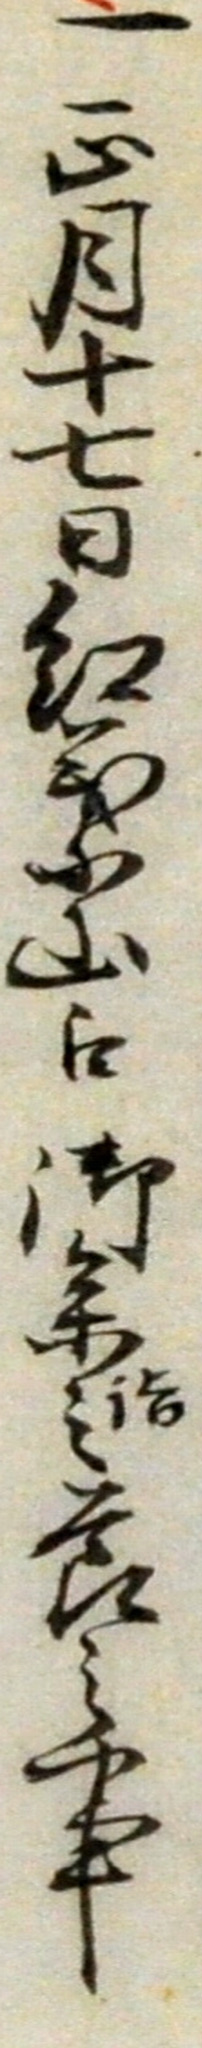一正月十七日紅葉山え御参詣之節之事
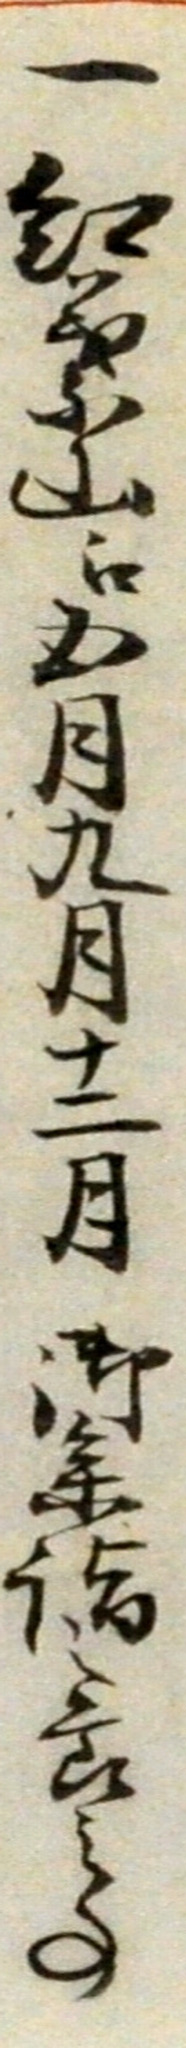一紅葉山え五月九月十二月御参詣之節之事
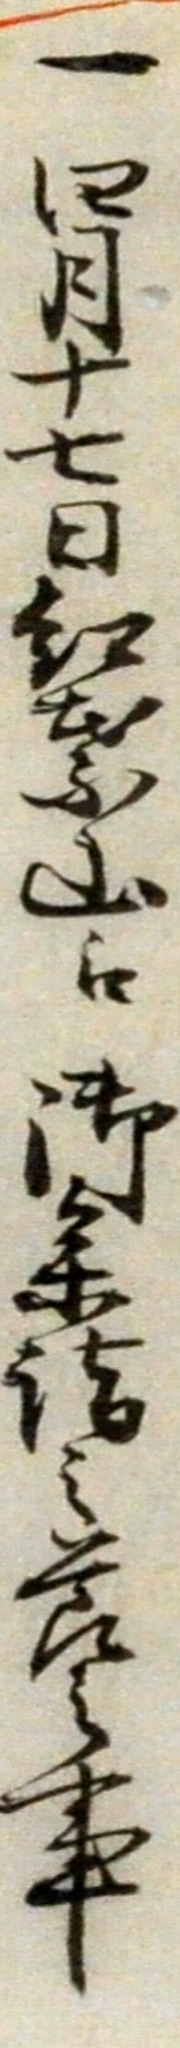一四月十七日紅葉山え御参詣之節之事
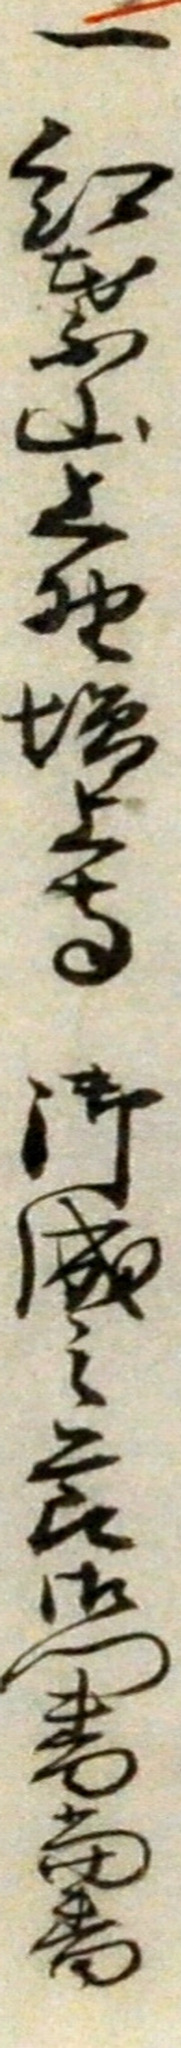一紅葉山上野増上寺御成之節御門番当番
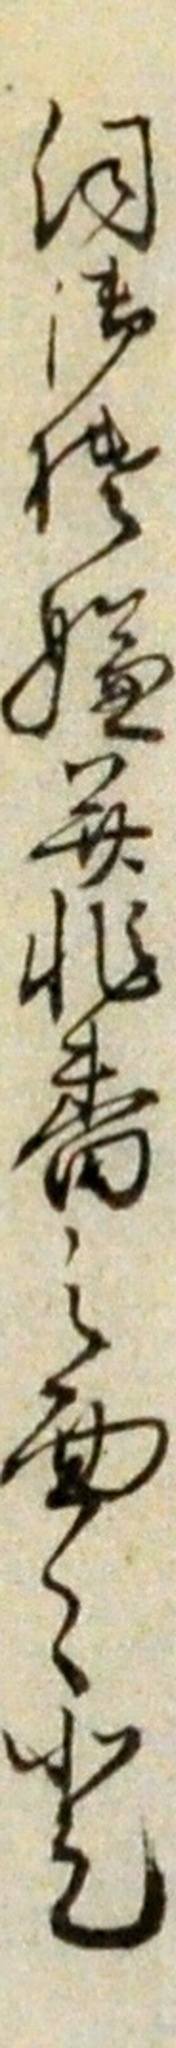伺御機嫌并非番之面々登
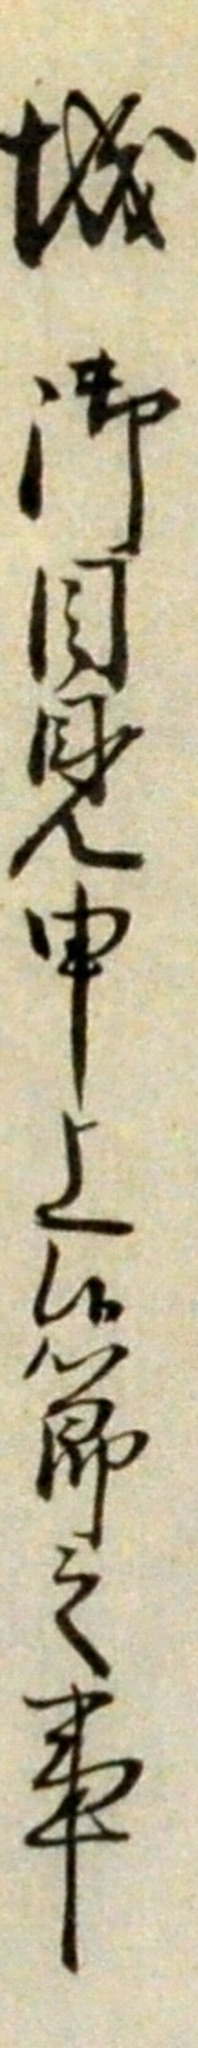城御目見申上候節之事
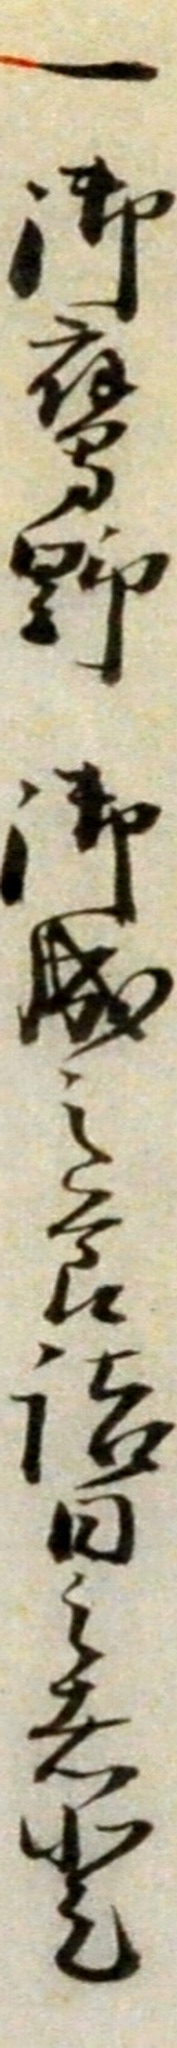一御鷹野御成之節詰日之者登
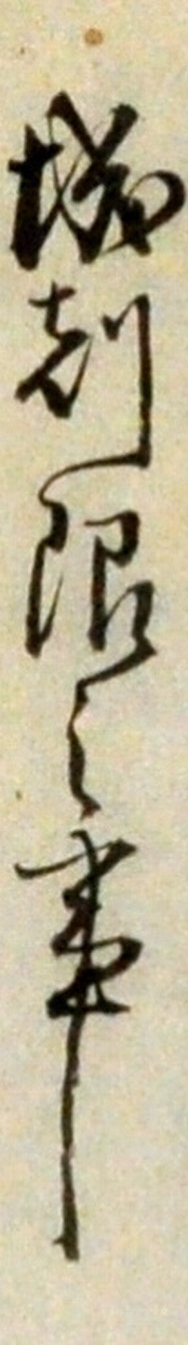城刻限之事
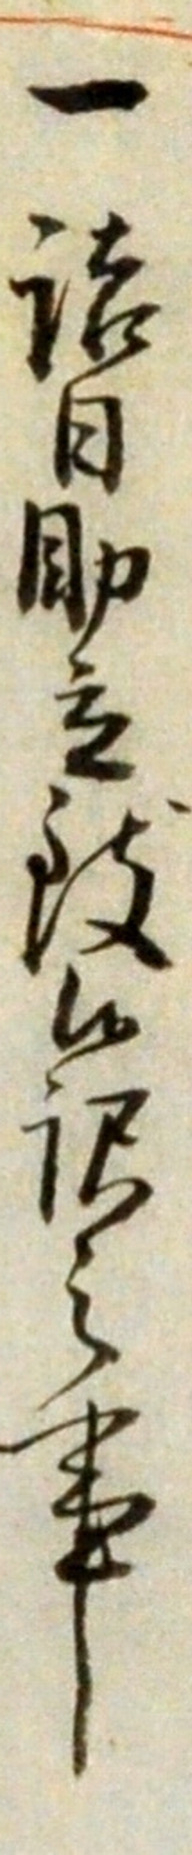一詰日助立致候訳之事
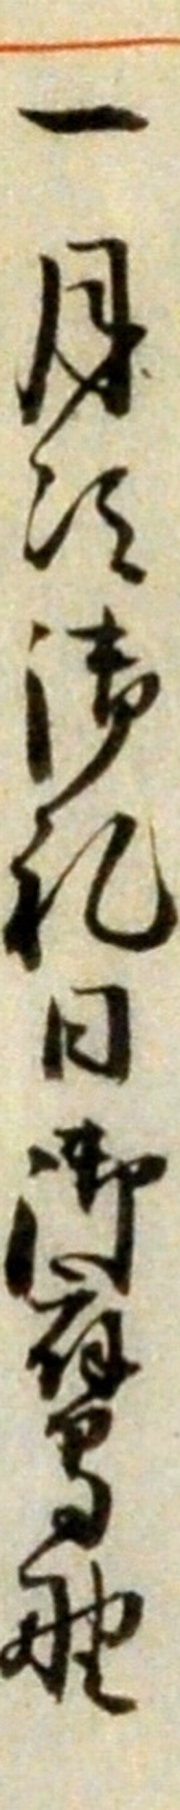一月次御礼日御鷹野
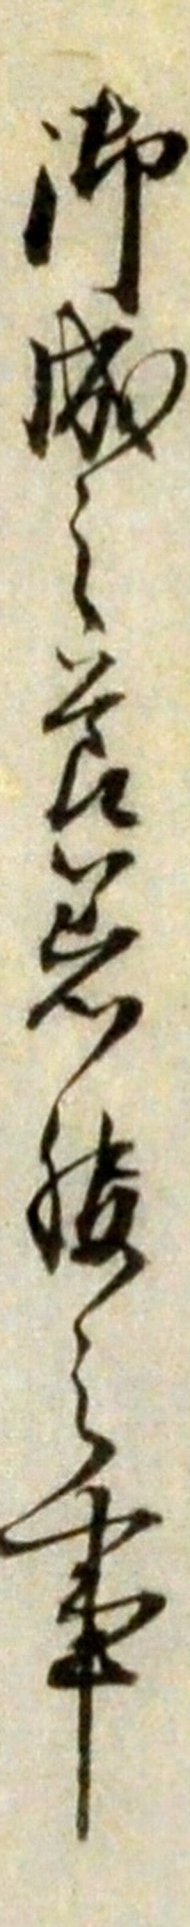御成之節着服之事
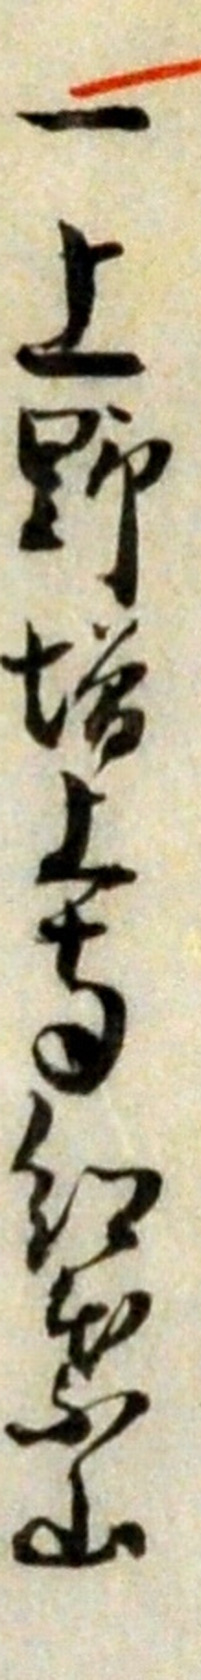一上野増上寺紅葉山
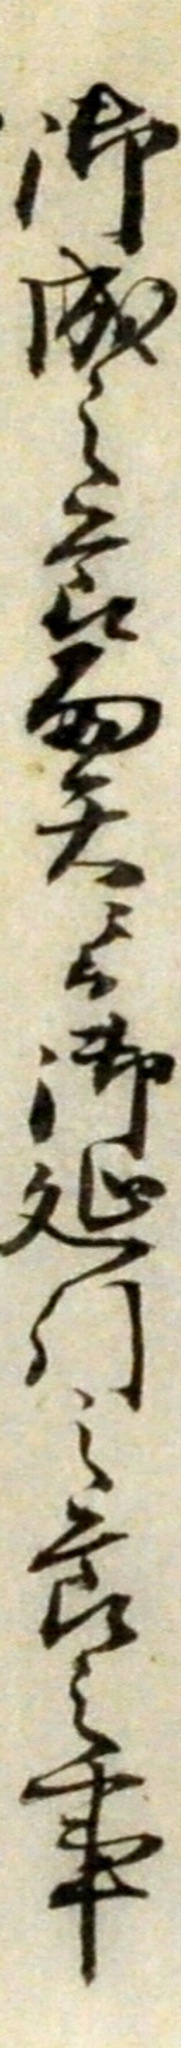御成之節雨天にて御延引之節之事
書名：申合帳〔一括〕
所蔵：伊那市立高遠町図書館・合同会社AMANE
